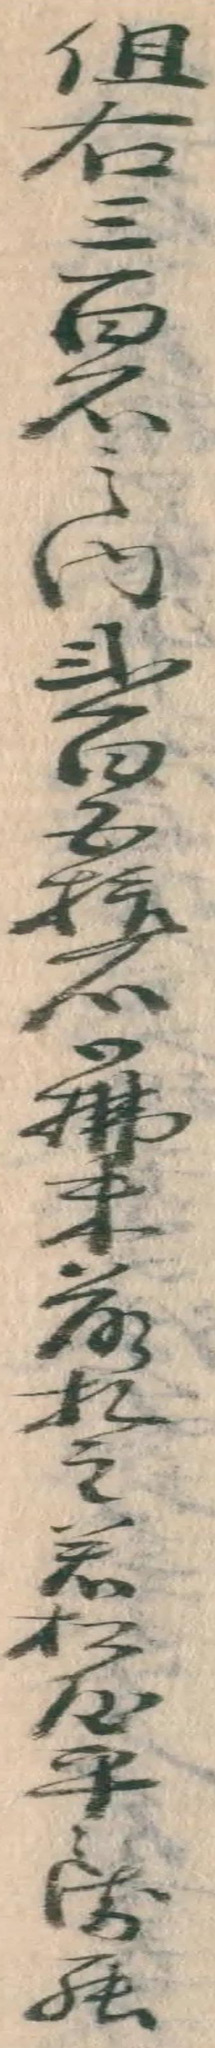但右三百石之内弐百五拾石御払米落札之若松屋平兵衛罷
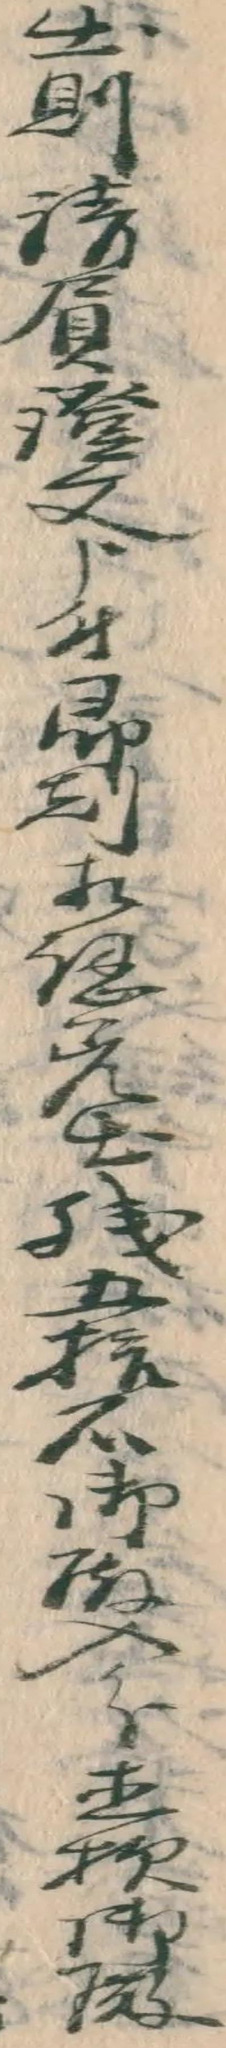出則請負證文申付即刻相認差出残五拾石御殿入分直様御帰
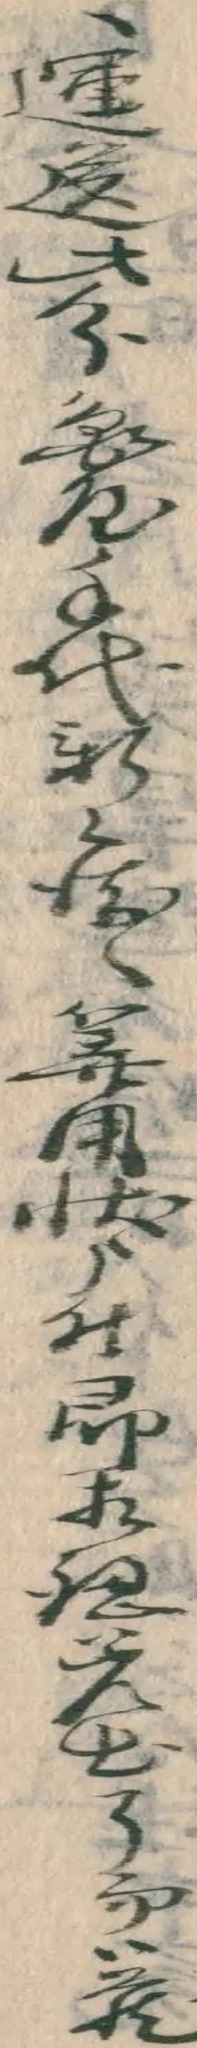へ運送此分亀屋手代新兵衛へ算用状申付即相認差出了而御蔵
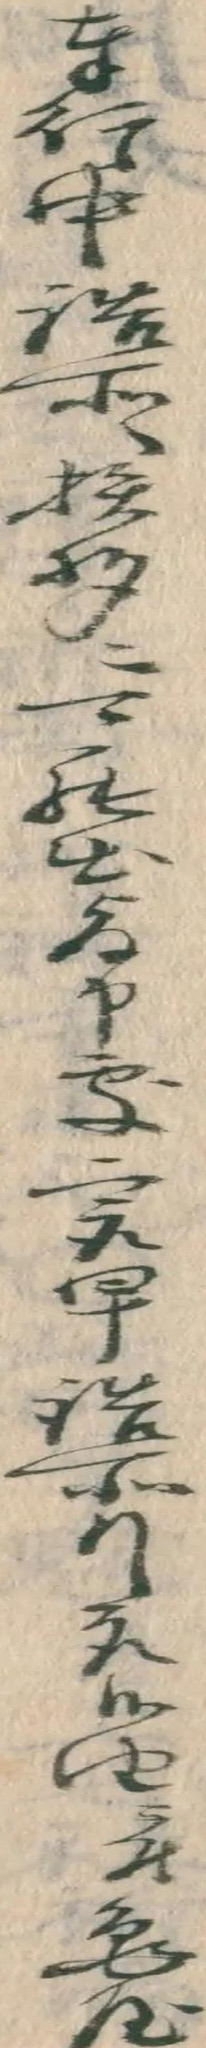奉行中詰所へ挨拶ニ可罷出旨申處最早詰所引取候由ニ付亀屋
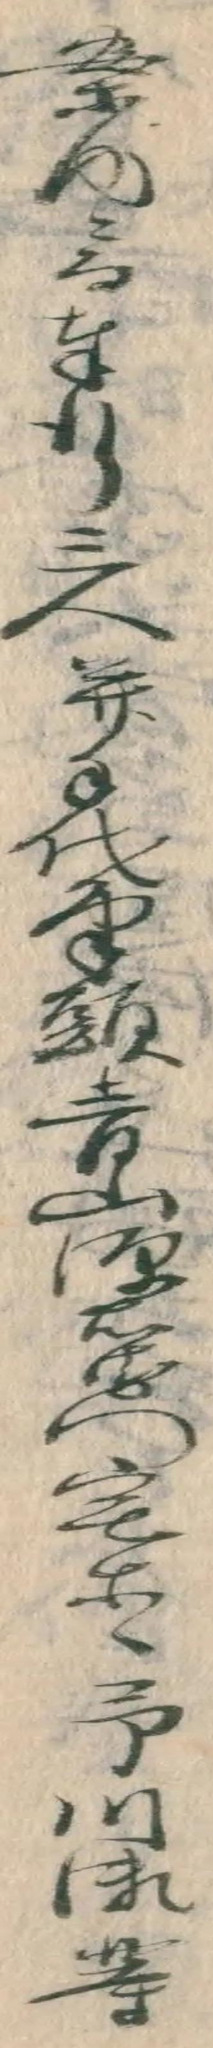案内ニ而奉行三人幷手代筆頭青山源右衛門宅等へ予川瀬等
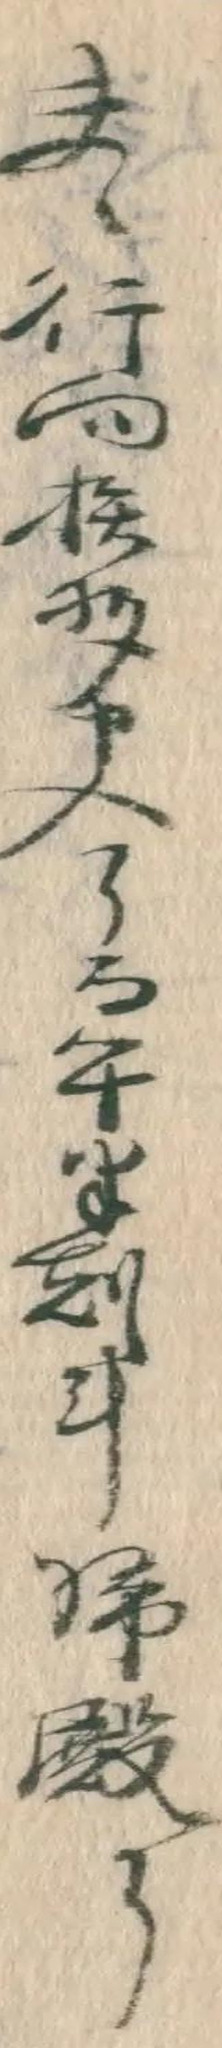夫々行向挨拶申入了而午半刻斗帰殿了
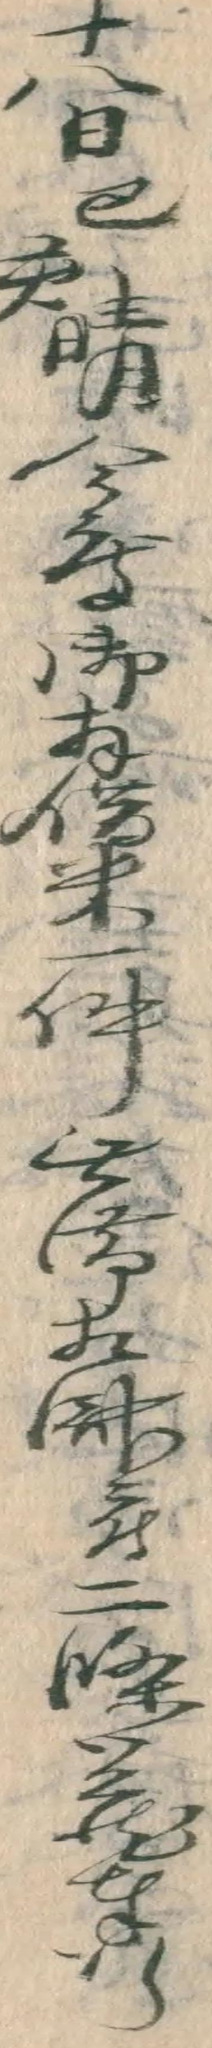十八日巳亥晴今度御拝借米一件無滞相済ニ付二條蔵奉行
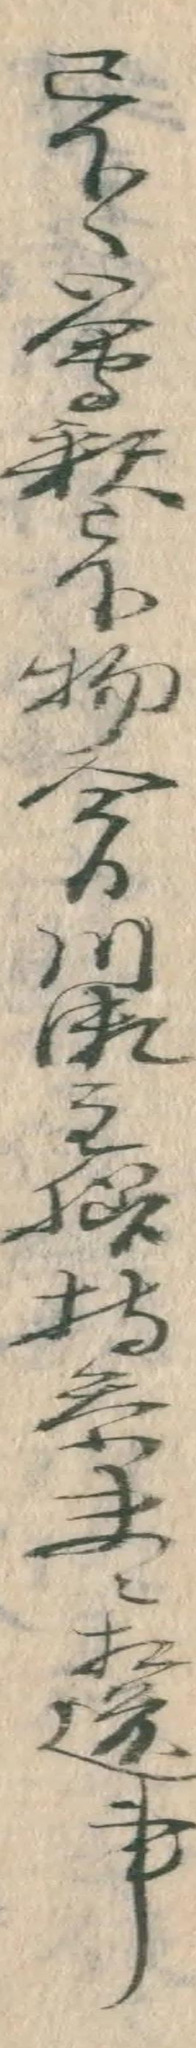已下へ御會釈被下物今日川瀬主税持参夫々相送事
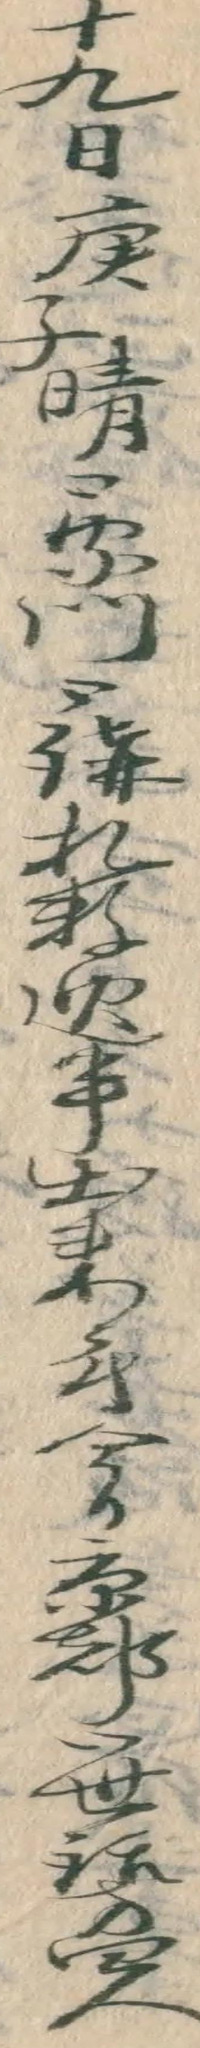十九日庚子晴御家門御講札数迎半出来ニ付今日京都御世話方四人
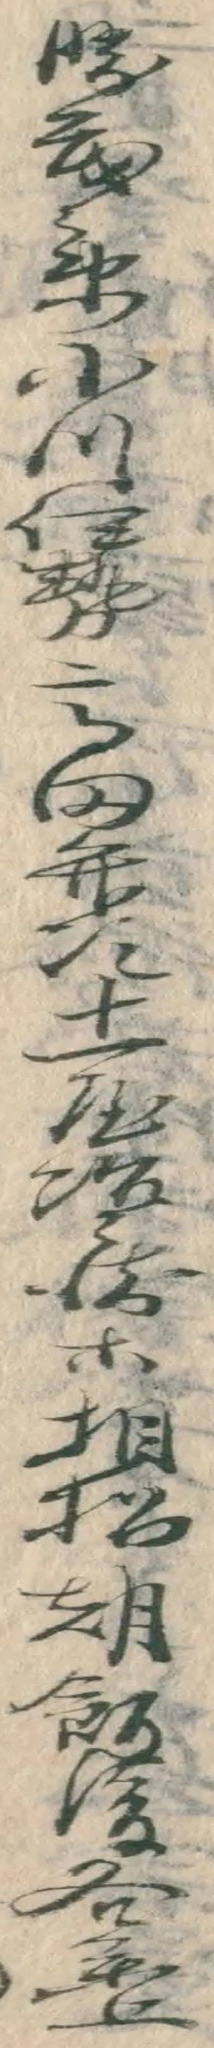勝茂兵衛小川伊勢高田弁次十一屋次兵衛等相招朝飯後冬参上
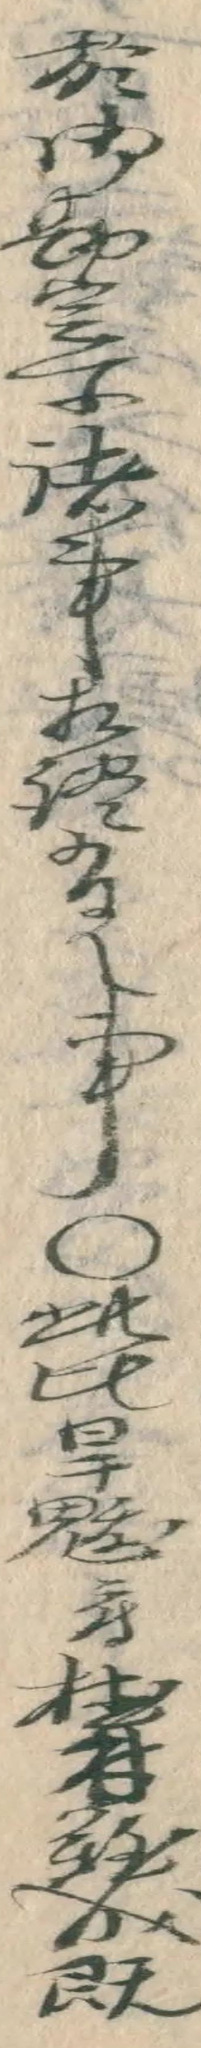於御勘定所諸事相談有之事○此頃旱魃ニ付植付難成既
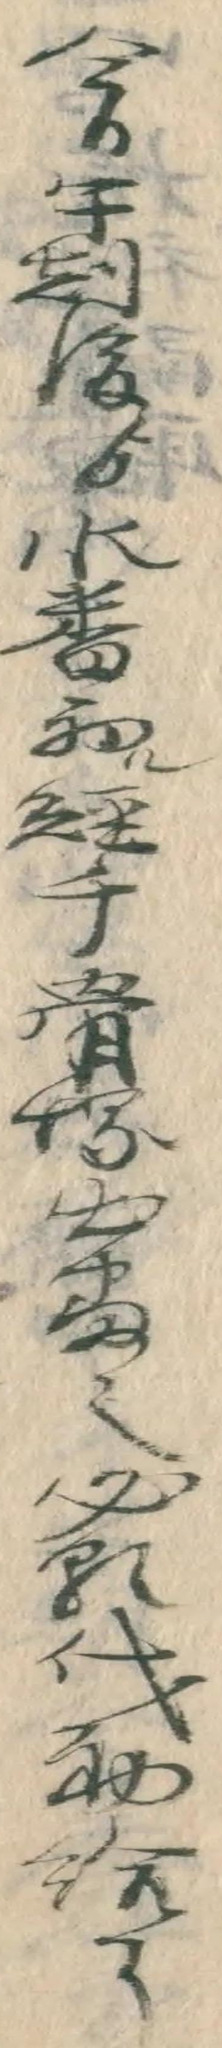今日午刻後ゟ水番勤ル経千骨塚出番也必類代勤給了
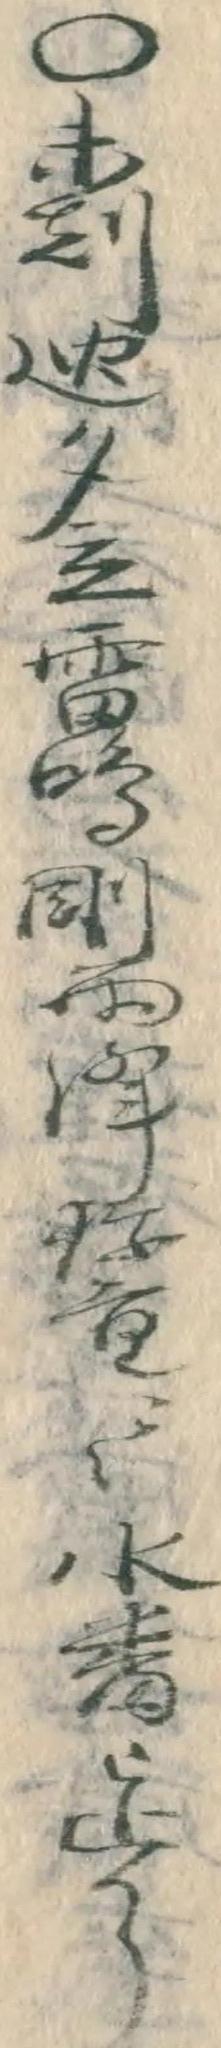〇未刻過夕立雷鳴剛雨降珍重々々水番被止了

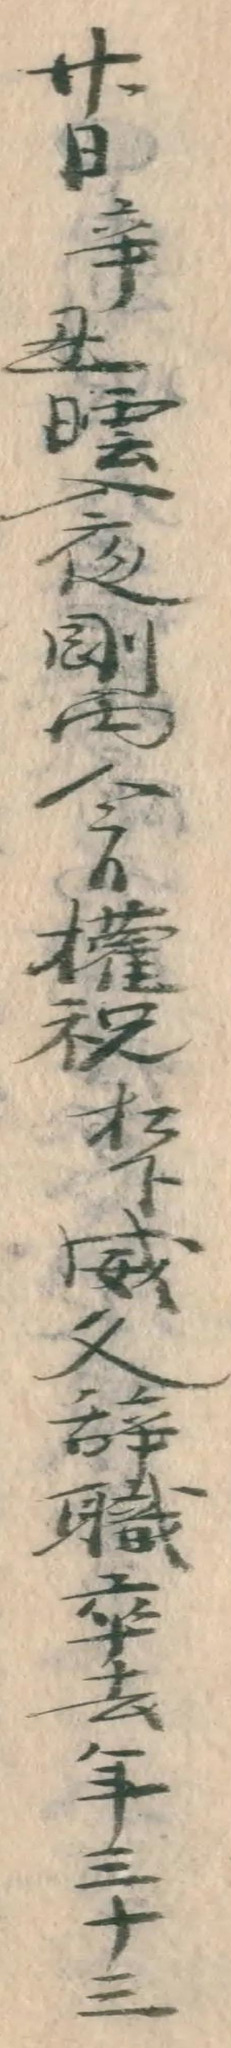廿日辛丑晴入夜剛雨今日権祝松下威久辞職卒去年三十三
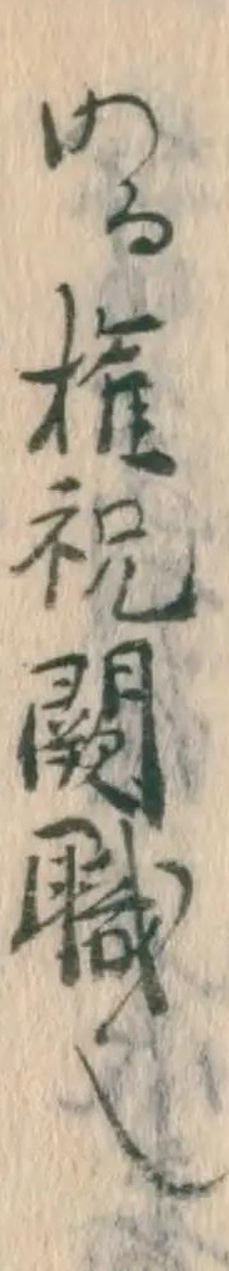仍而権祝闕職也
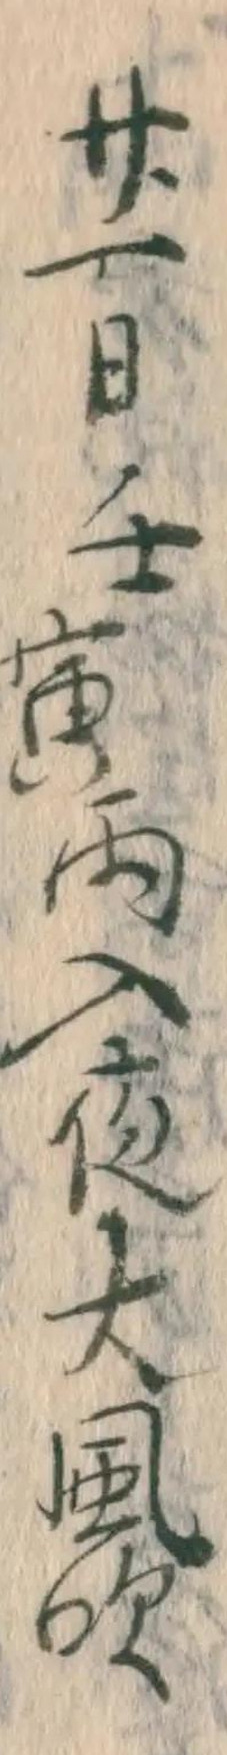廿一日壬寅雨入夜大風吹
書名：賀茂社記録. 第65冊
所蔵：国立国会図書館 National Diet Library, JAPAN
